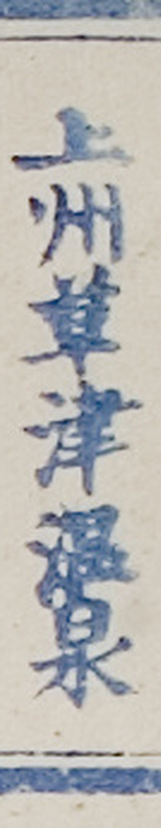上州草津温泉
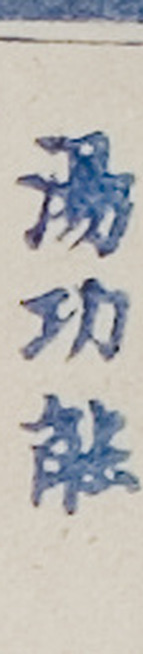湯効能
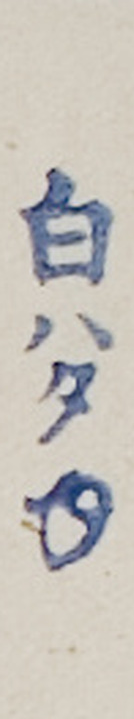白ハタゆ
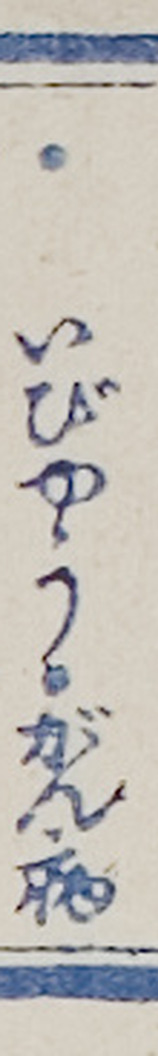・いびやう・がん病
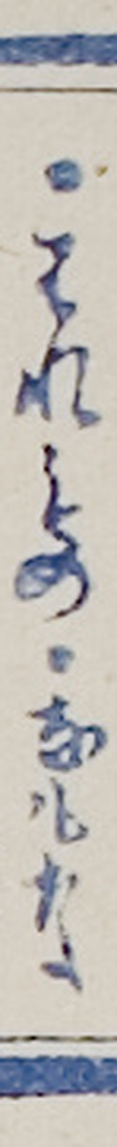・はれもの・なもな
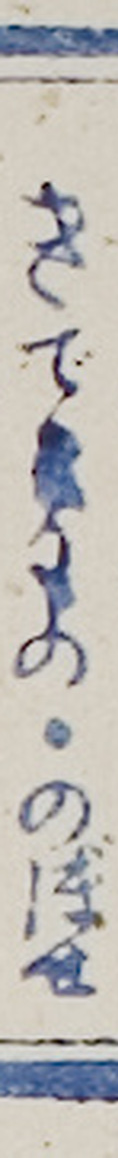きできもの・のぼせ
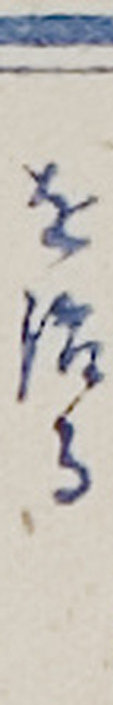を治る
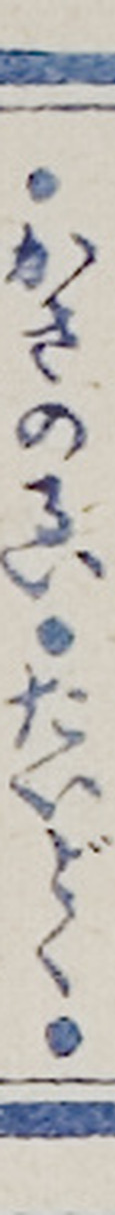・かさのるい・たいどく・
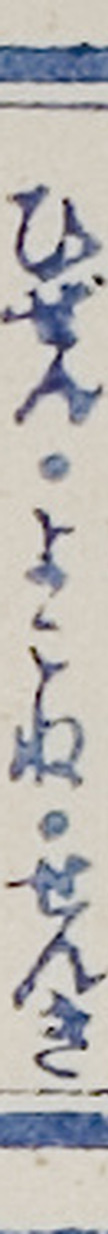ひぜん・よこね・せんき
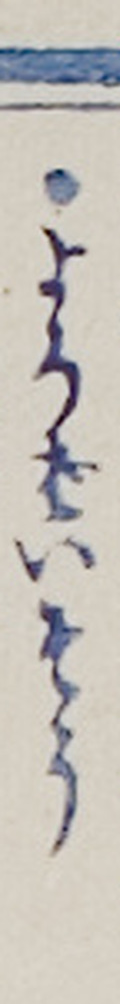・ようばいそう
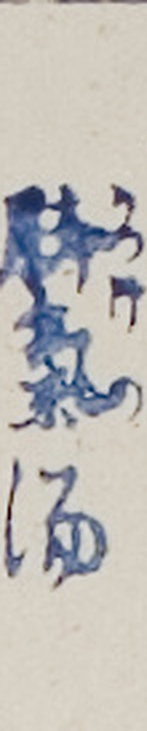脚気湯
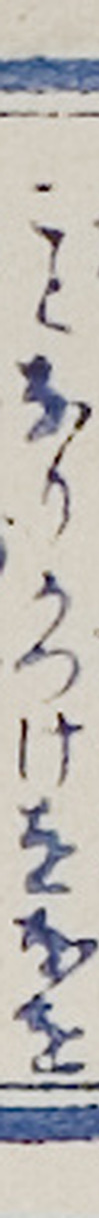ことなりうつぃけをなを
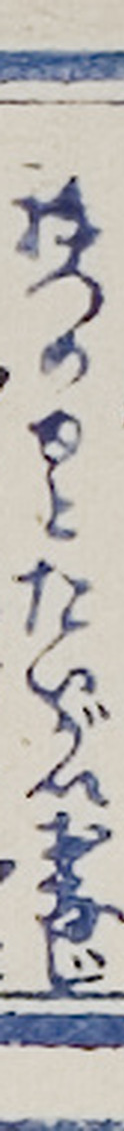・ねつのゆとたいがいおなじ
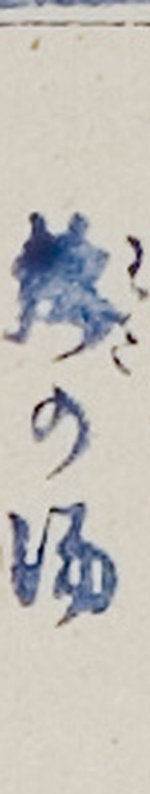熱の湯
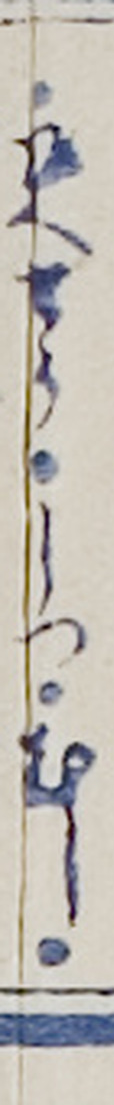へせう・しつ・むし・
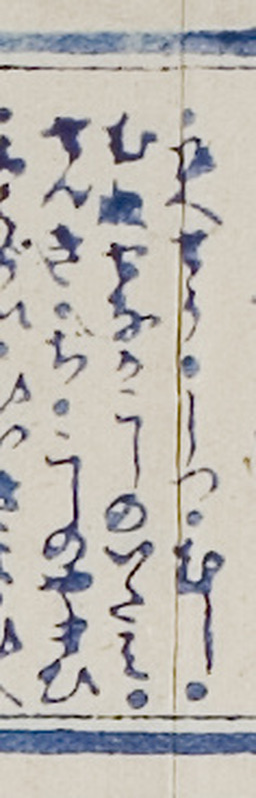むぢなかこしのいたみ・
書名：諸国温泉鑑 上州草津温泉図
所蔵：東京大学総合図書館 General Library in the University of Tokyo, JAPAN
